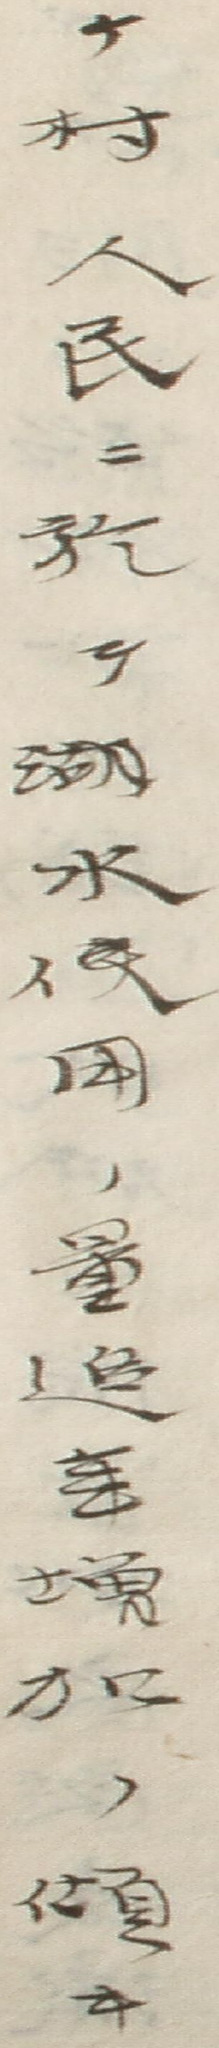ケ村人民ニ於テ湖水使用ノ量追年増加ノ傾キ

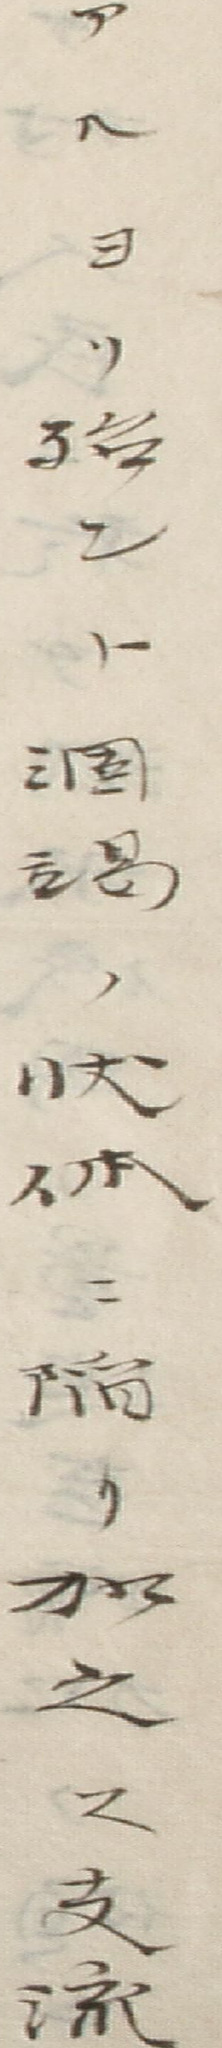アルヨリ殆ント涸竭ノ状体ニ陥リ加之ス支流
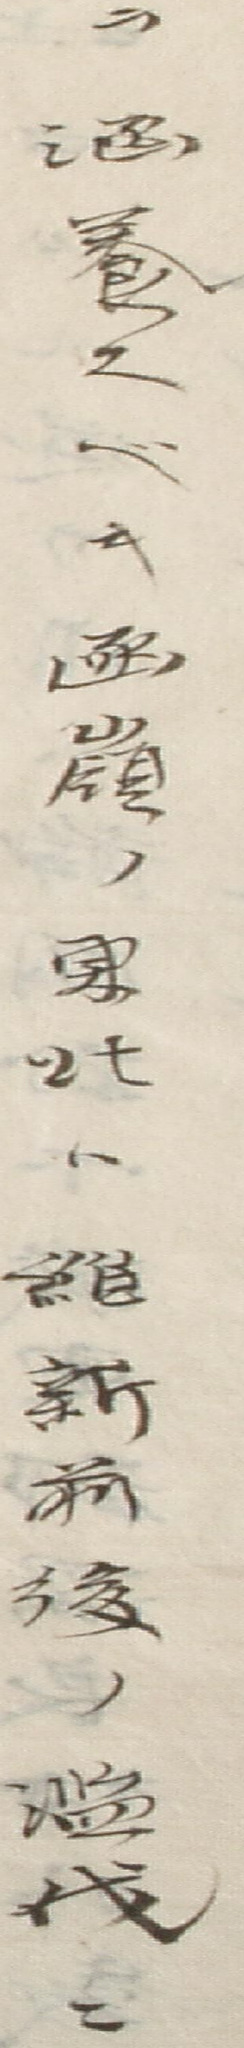ヲ涵養スベキ函嶺ノ東北ハ維新前後ノ濫伐ニ
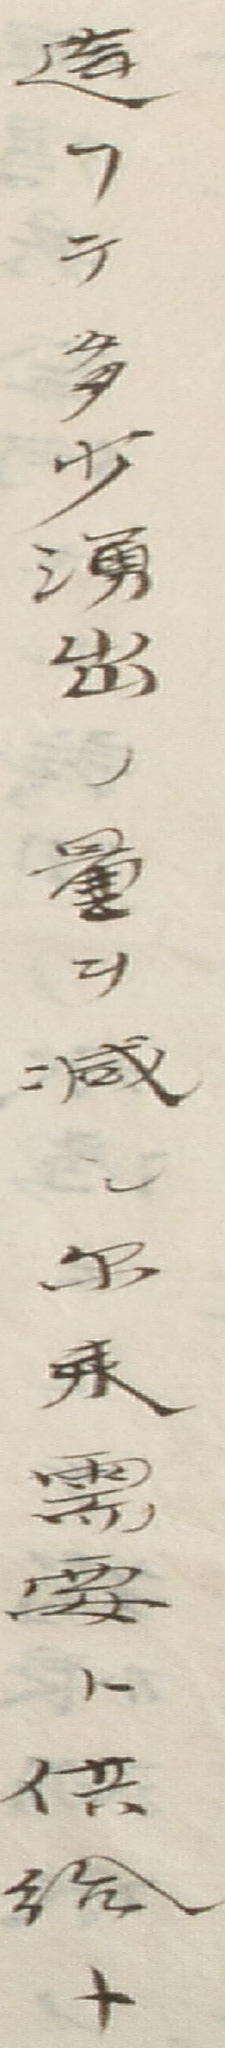遭ツテ多少湧出ノ量ヲ減シ尓来需要ト供給ト
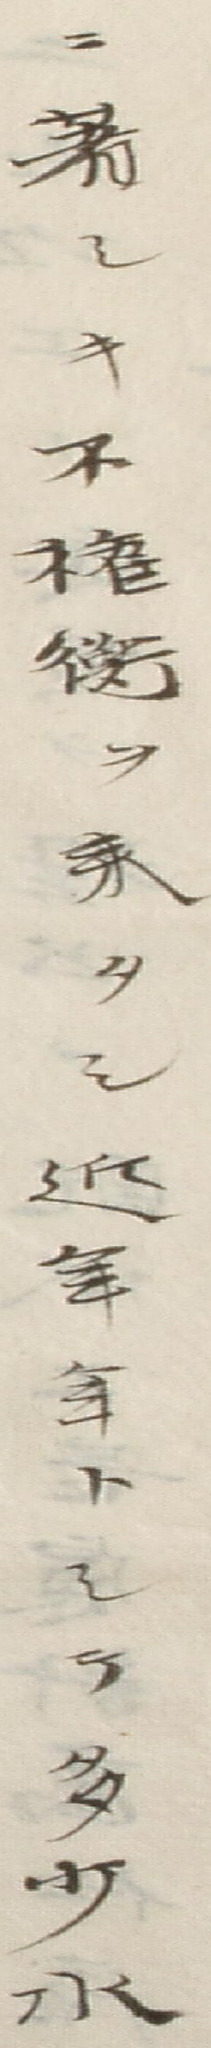ニ著シキ不権衡ヲ来タシ近年年トシテ多少水
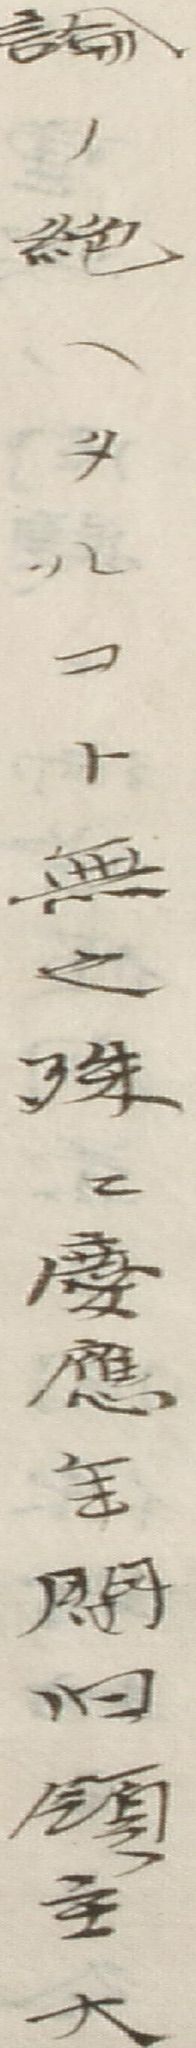論ノ絶ヘタルコト無之殊ニ慶応年間旧領主大
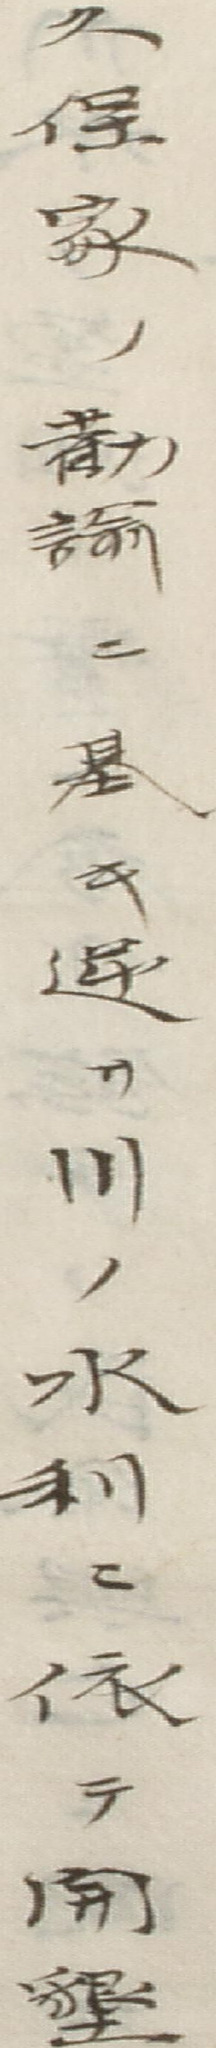久保家ノ勸諭ニ基キ逆サ川ノ水利ニ依テ開墾
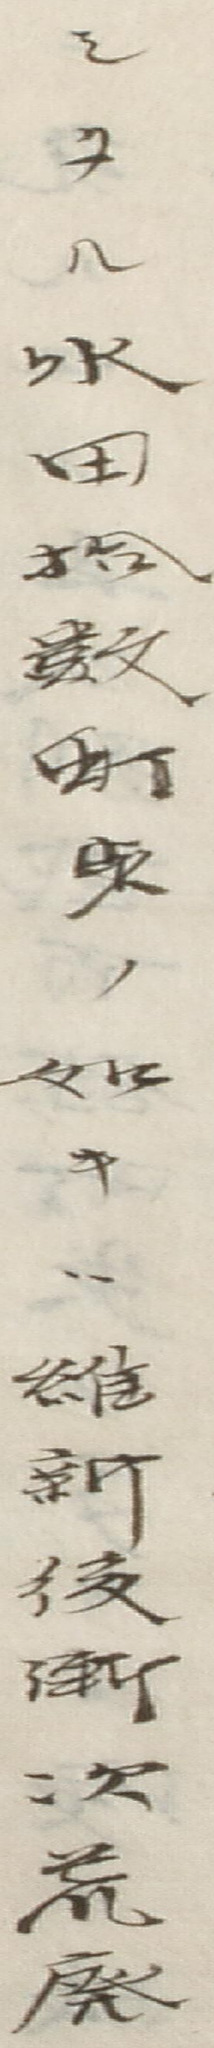シタル水田拾数町歩ノ如キハ維新後漸次荒廃
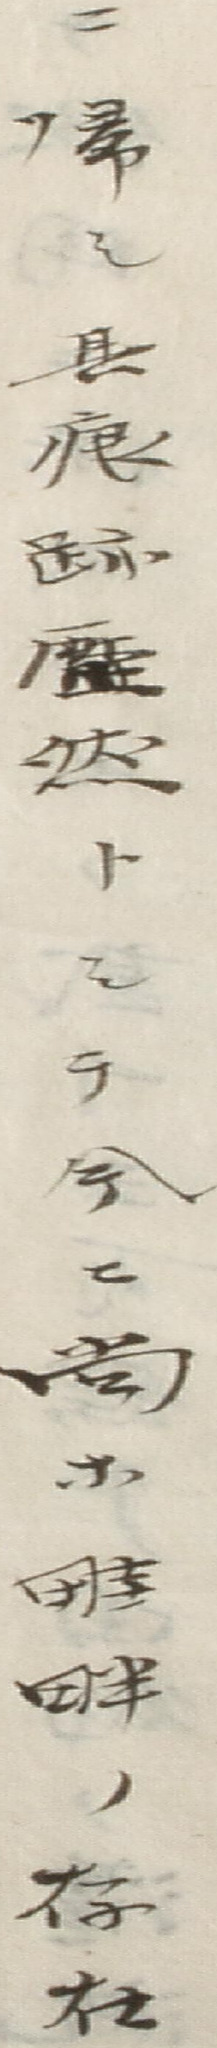ニ帰シ其痕跡歴然トシテ今ニ尚ホ畦畔ノ存在
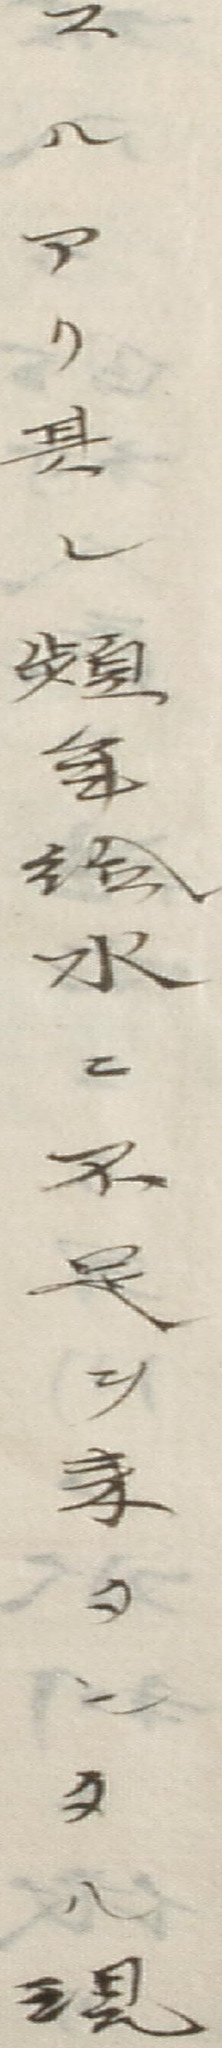スルアリ其レ頻年給水ニ不足ヲ来タシタル現
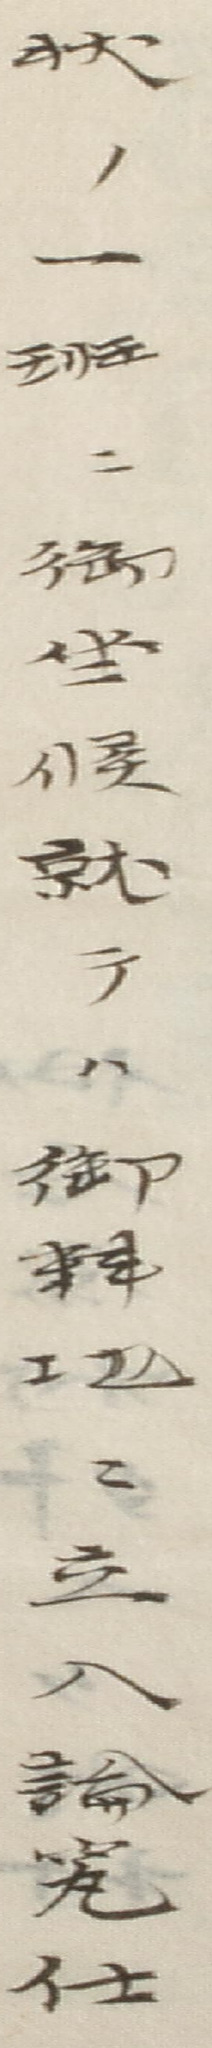状ノ一班ニ御座候就テハ御料地ニ立入論究仕
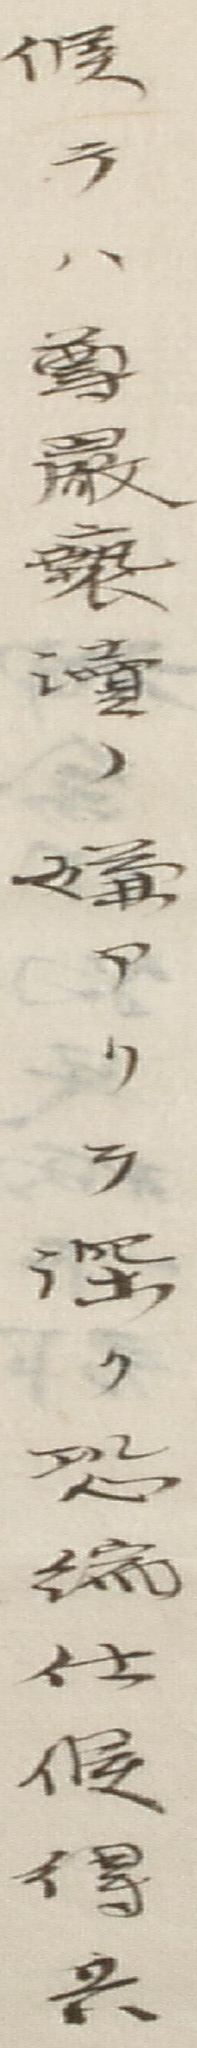候テハ尊厳褻瀆ノ嫌アリテ深ク恐縮仕候得共
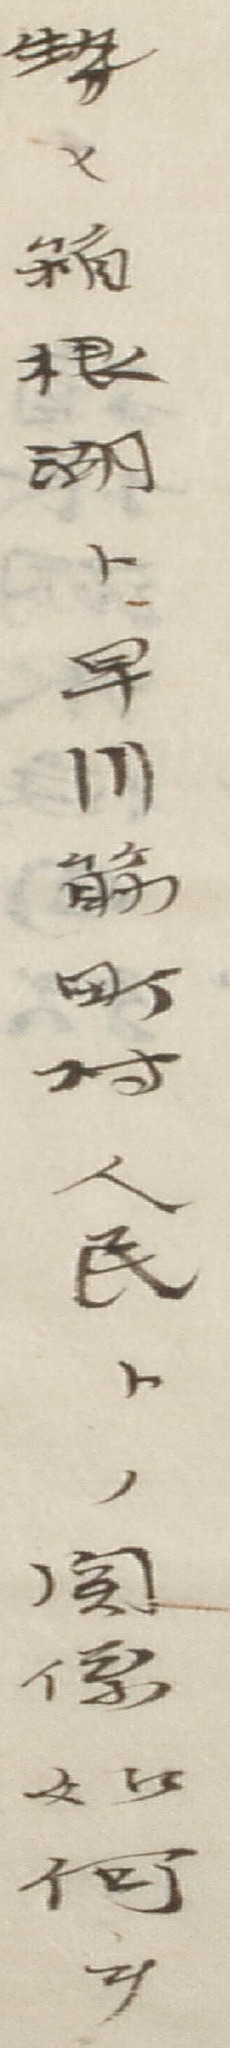勢ヒ箱根湖ト早川筋町村人民トノ関係如何ヲ
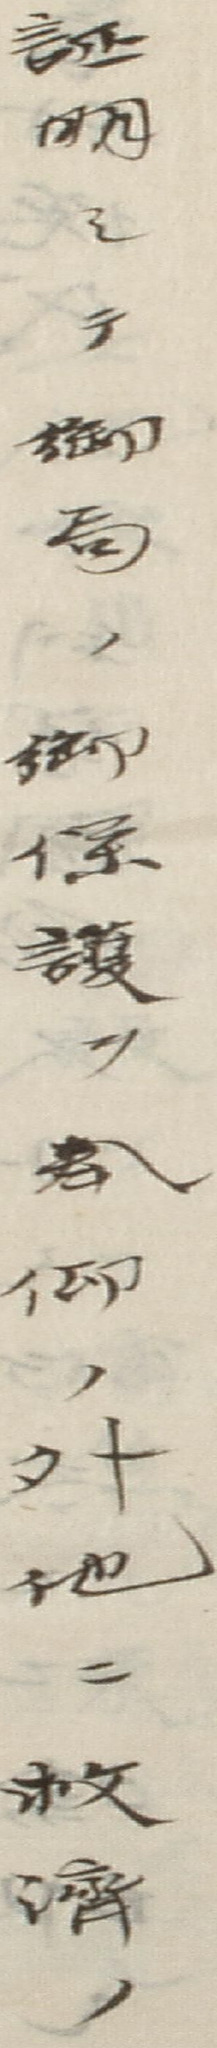証明シテ御局ノ御保護ヲ奉仰ノ外他ニ救済ノ
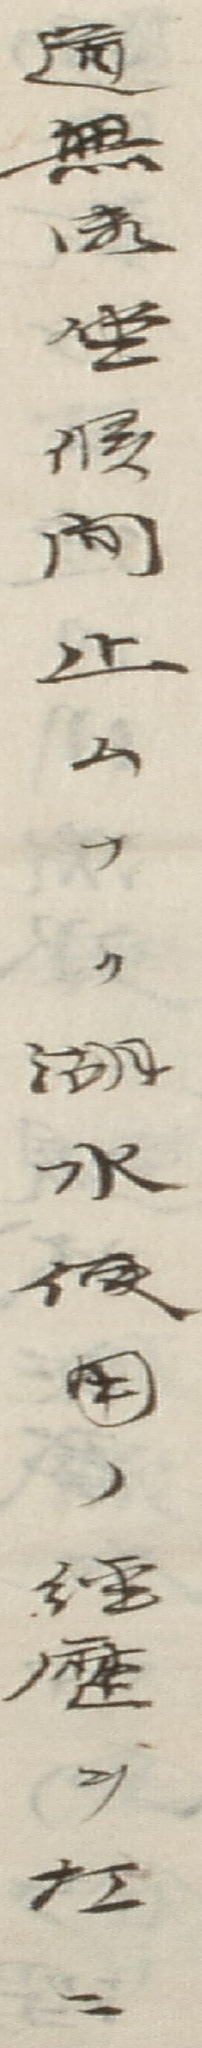道無御座候間止ムナク湖水使用ノ経歴ヲ左ニ
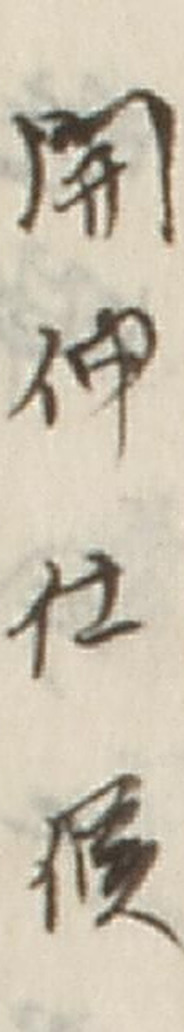開伸仕候
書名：箱根湖水使用願　神奈川縣足柄下郡仙石原村外七ヶ町村
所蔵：東京大学地震研究所図書室 Earthquake Research Institute Library, The University of Tokyo, JAPAN
